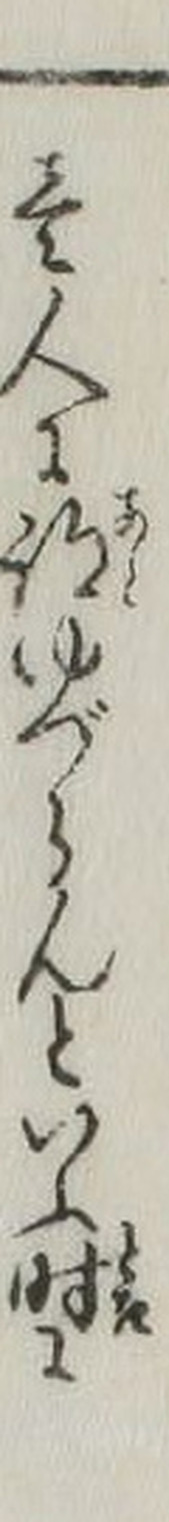壱人に跡ゆづらんといふ時に
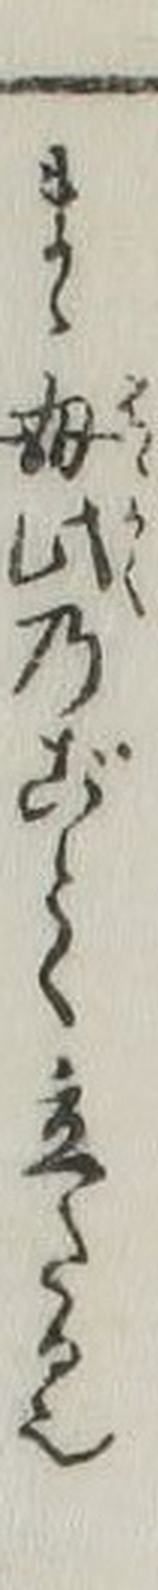まゝ母此のごとく立たる也
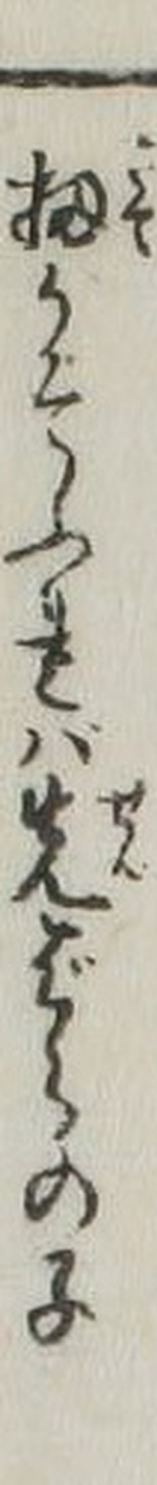扨かぞふれば先ばらの子
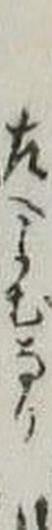左へよむなり
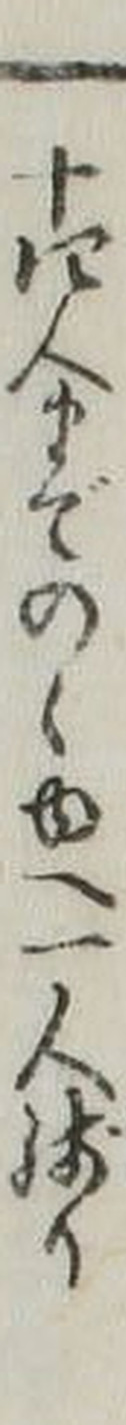十四人までのくゆへ一人残り
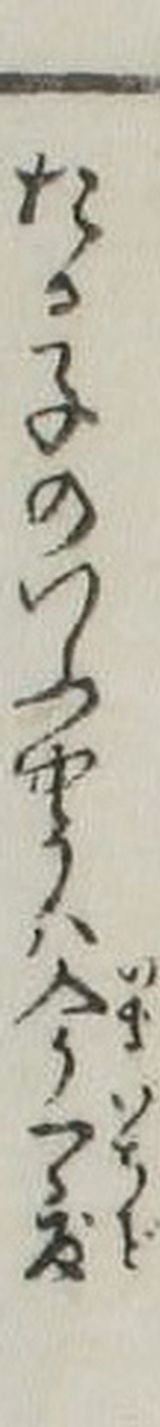たる子のいふやうは今一度
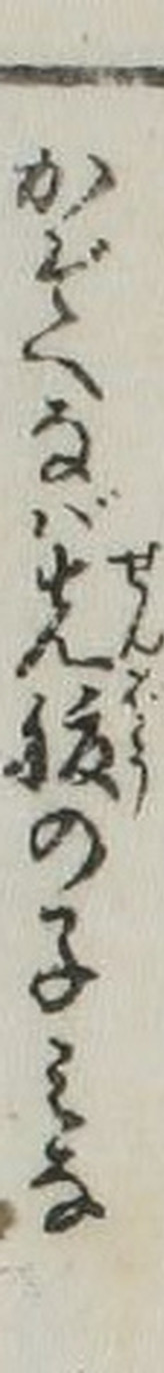かぞへなば先腹の子みな
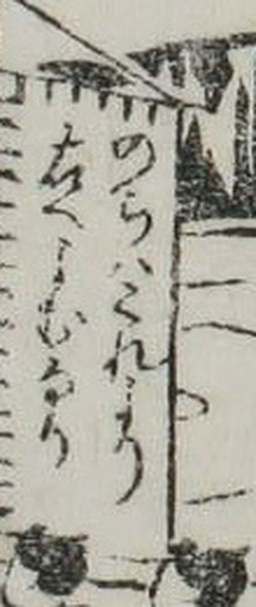のちはこれより
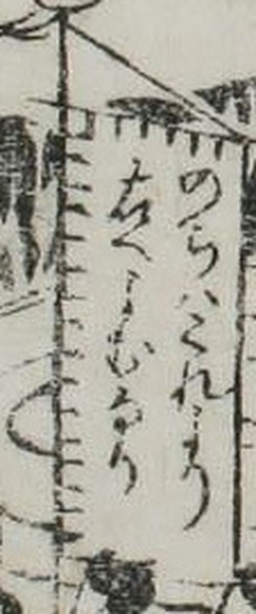右へよむなり
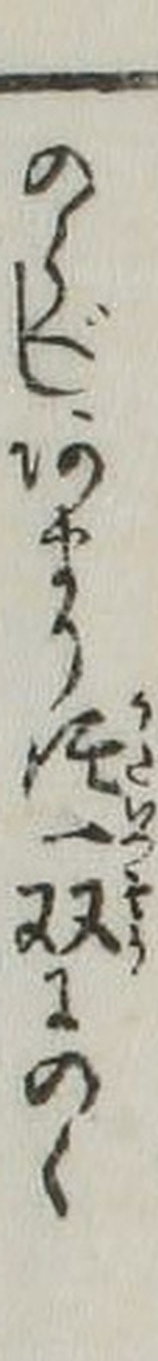のくべしあまり片一双にのく
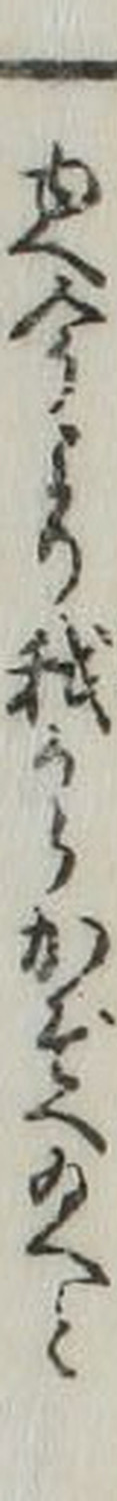ゆへ今より我からかぞへゐへと
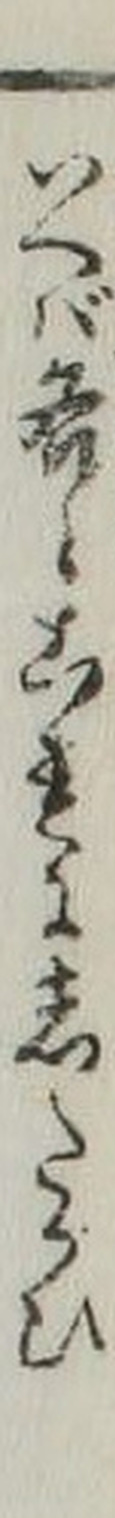いへば各々これにしたがひ
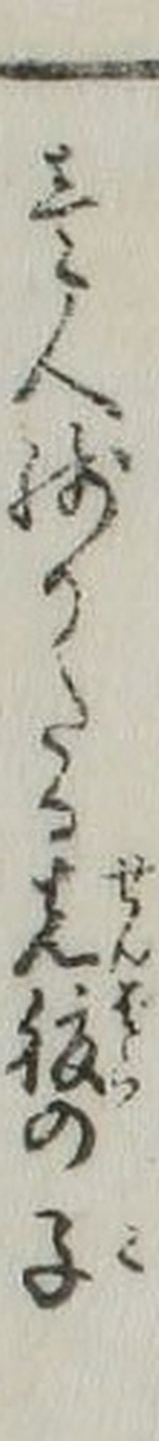壱人残りたる先腹の子
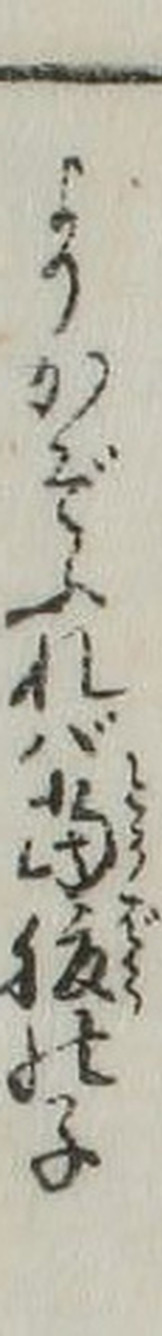よりかぞふれば当腹の子
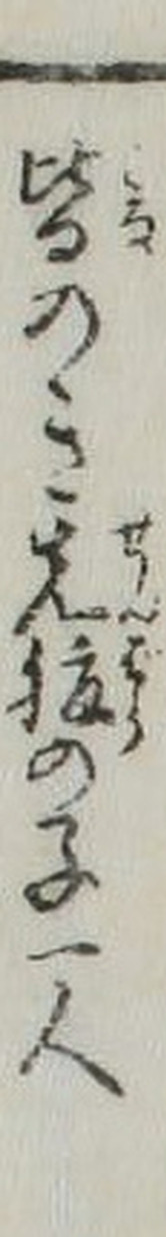皆のき先腹の子一人
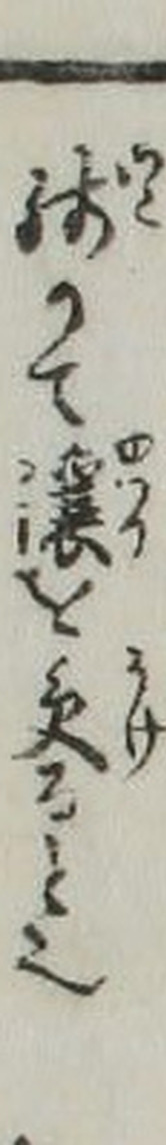残りて譲を受ると也
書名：宝玉塵劫記
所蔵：東京学芸大学教育コンテンツアーカイブ
